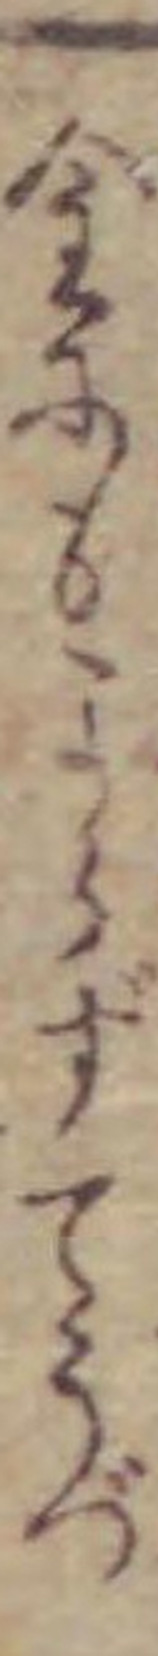金にもよらずてうづ
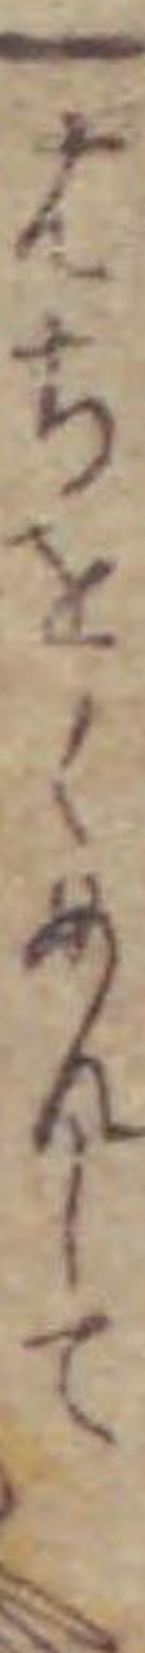はちをくめんして
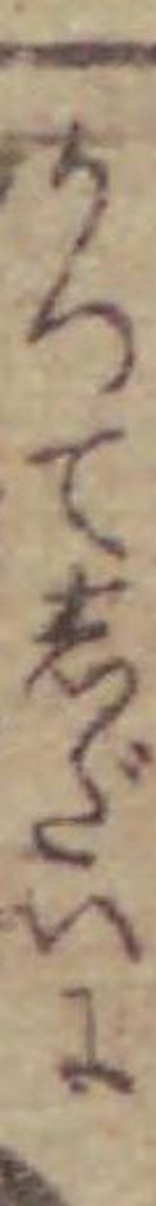かつてしだいに
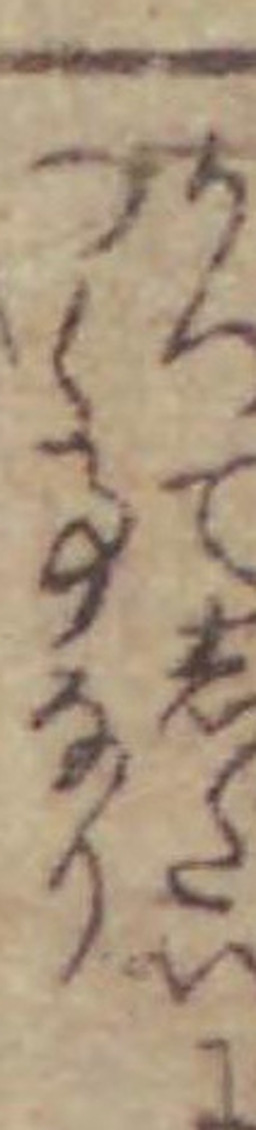つく事なり
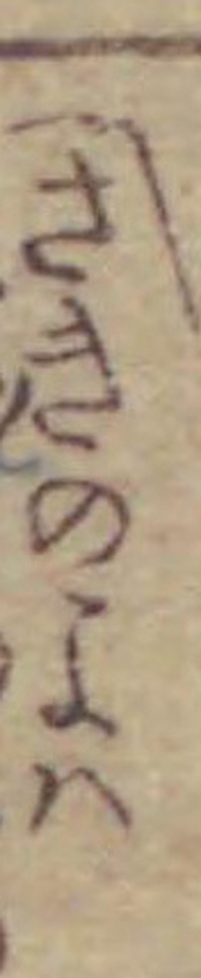「さきのよは
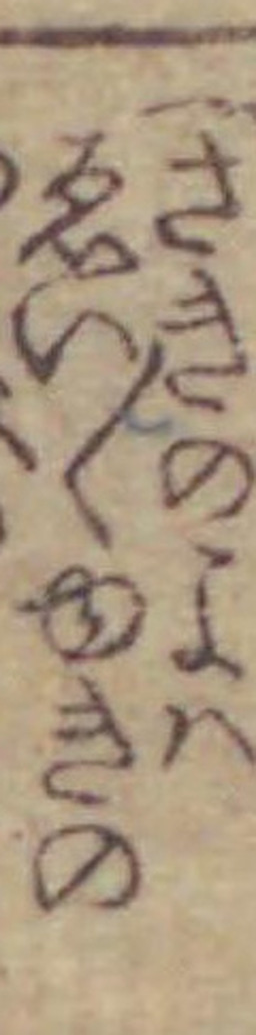ゑい〳〵ゆきの
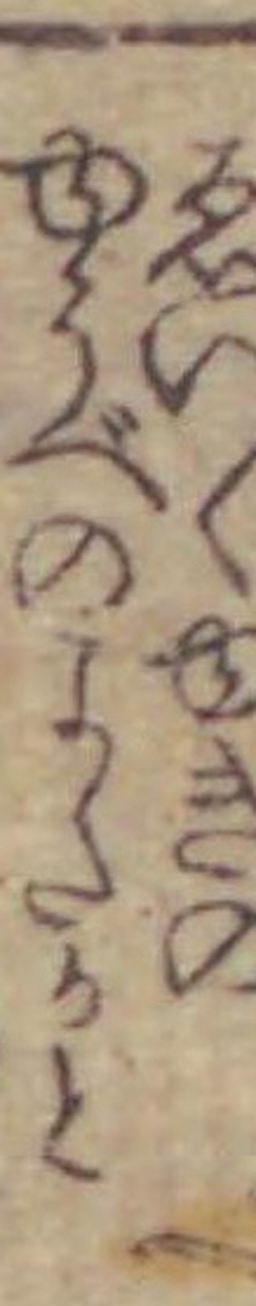ゆうべのよたかと
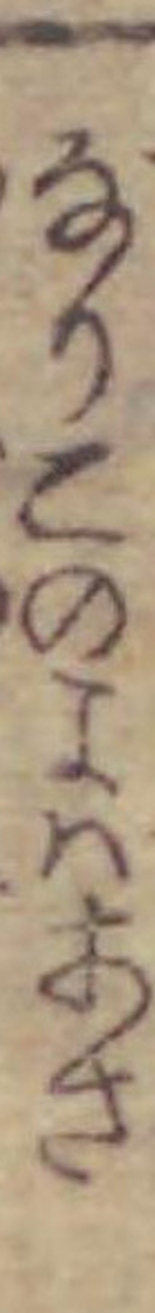なりこのよはあさ
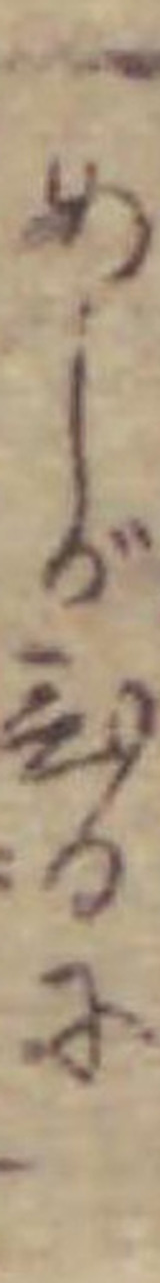めしがひるに
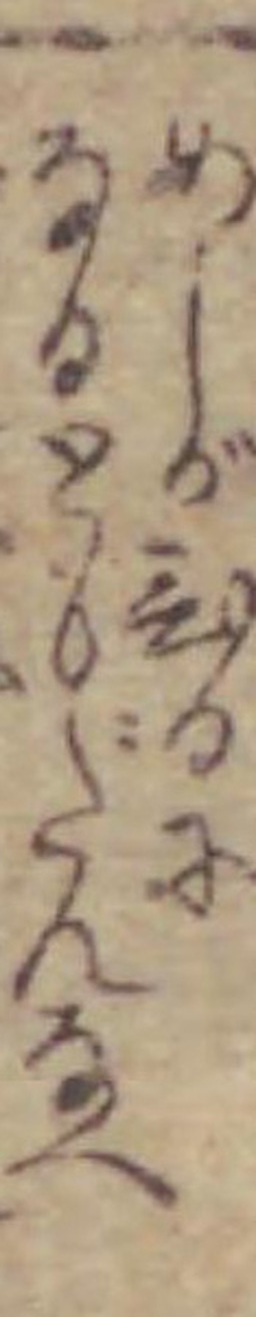なるともだんなへ
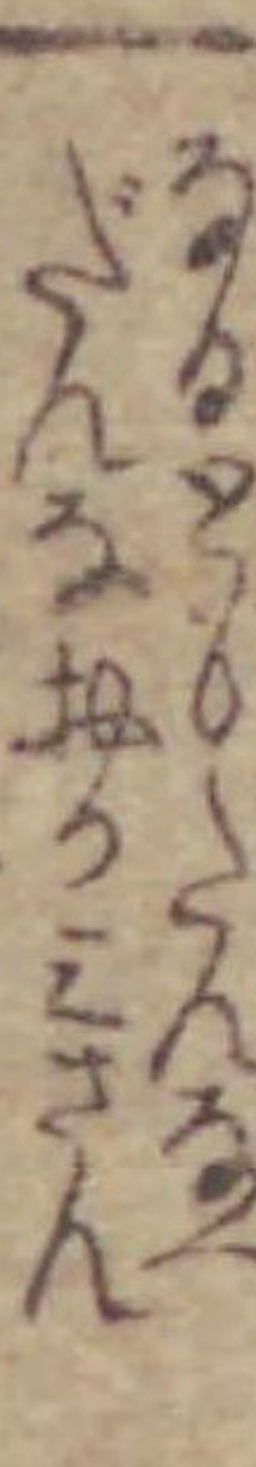だんなおかみさん
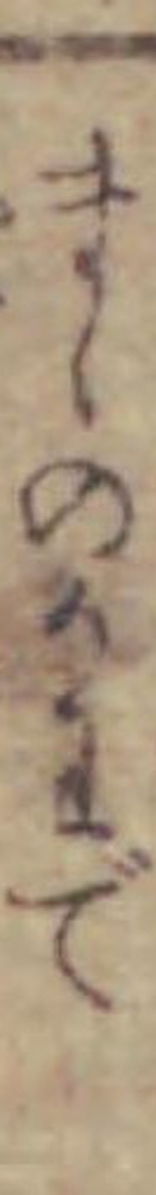ましのかわで
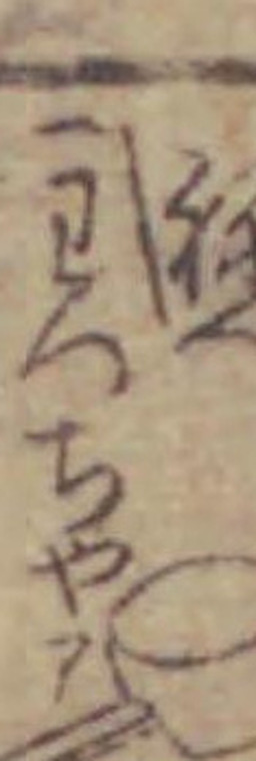「わつちやァ
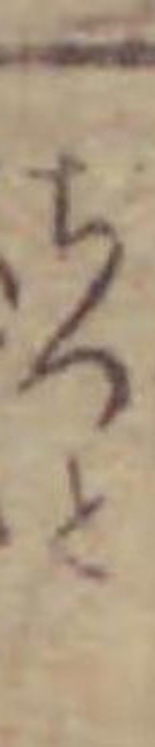ちつと
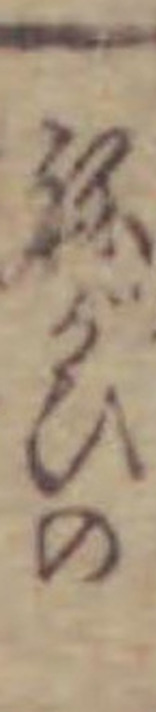ねがひの
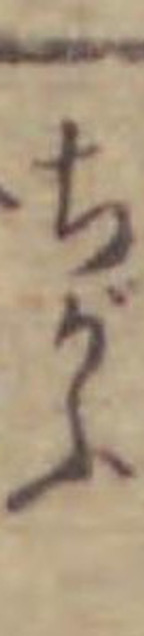ちがふ
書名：九替十年色地獄 : 3巻
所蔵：国立国会図書館 National Diet Library, JAPAN
